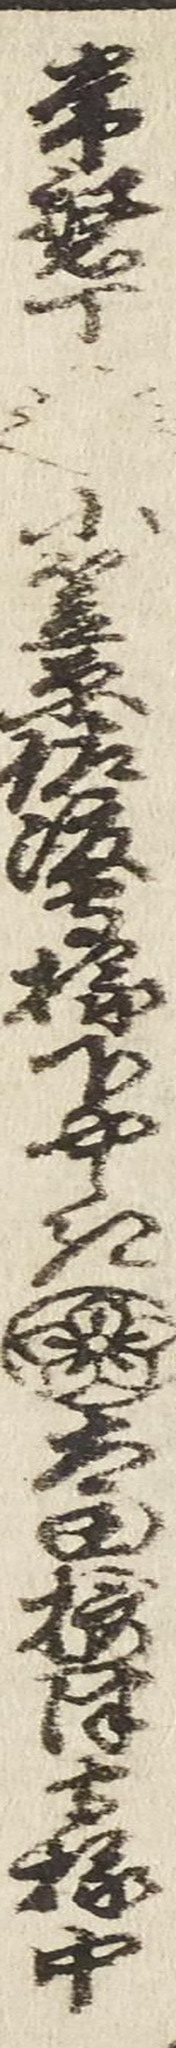常磐丁小笠原佐渡守様下やしき太田摂津守様中
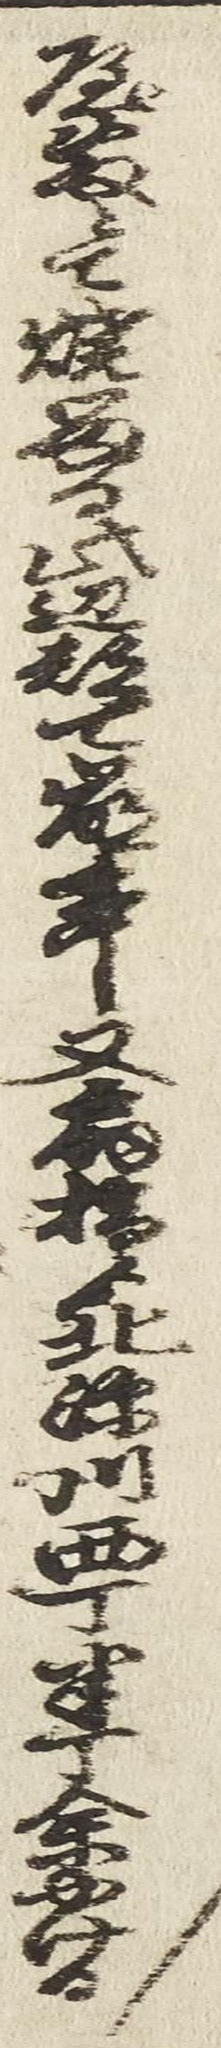屋敷ニて焼留る此辺都て崩多し又扇橋ゟ北深川西丁半丁余やける
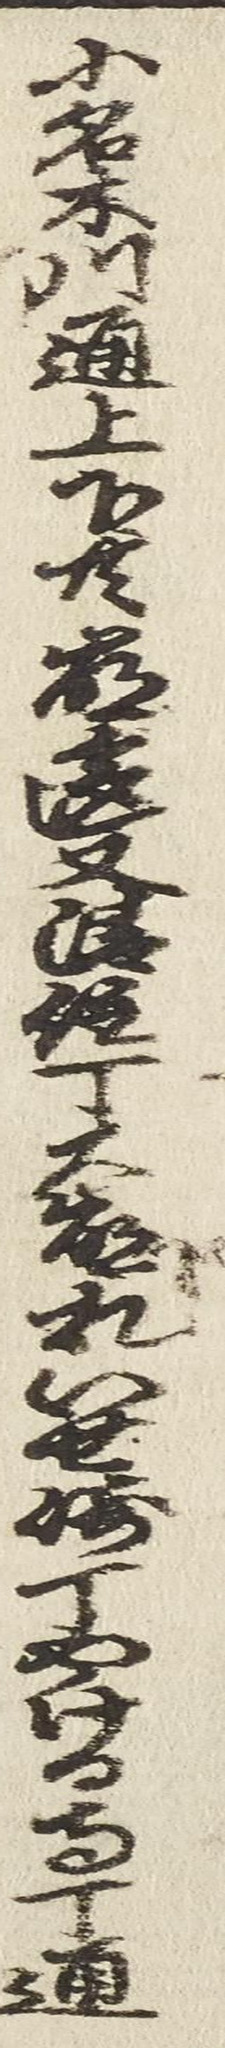小名木川通上下共崩多し又清住丁大崩れいせ崎丁やける寺丁通
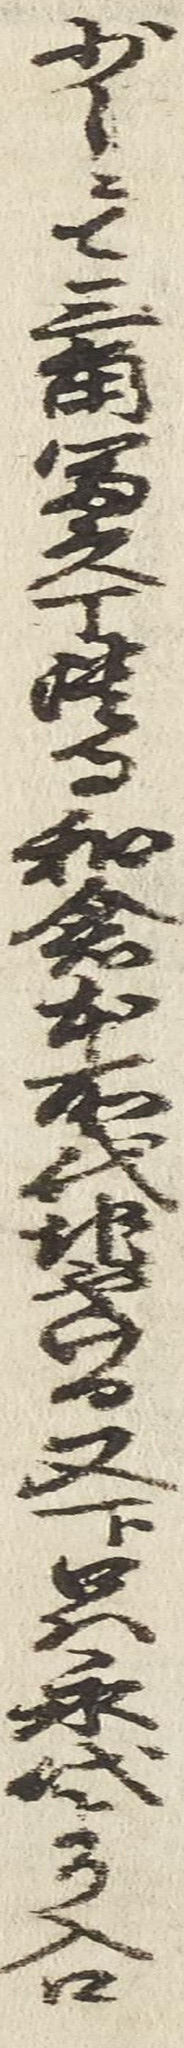少しニて三角富久丁潰る和倉本所代地やける又一ト口は永代より入口
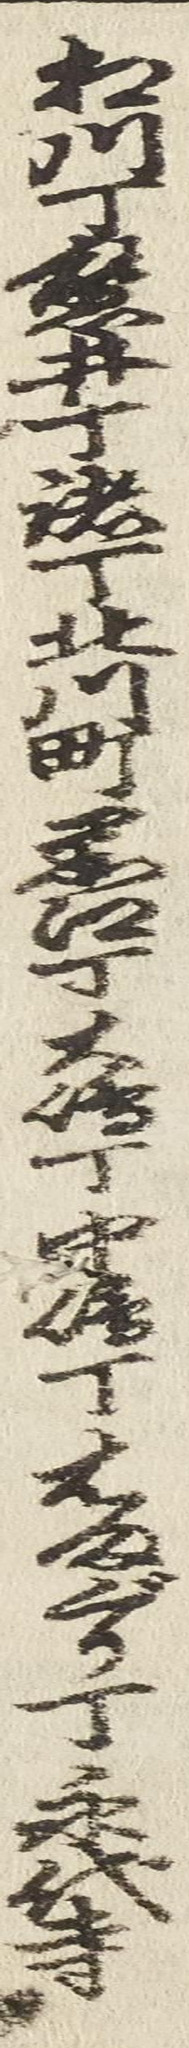相川丁熊井丁諸丁北川町黒江丁大嶋丁中嶋丁はまぐり丁永代寺
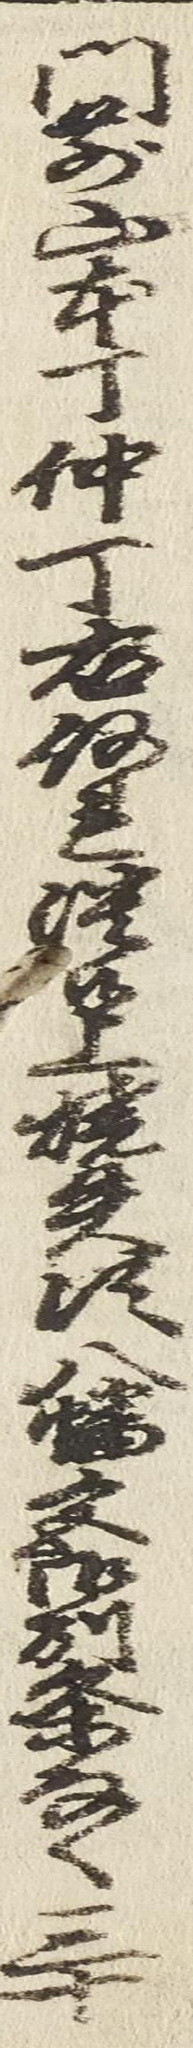門前山本丁仲丁右何れ潰候上焼失す八幡宮別条なく三十
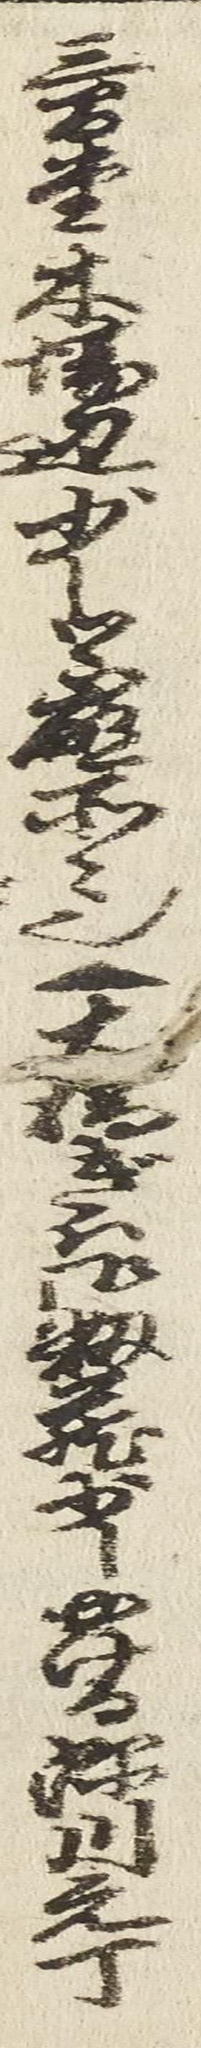三間堂木場辺少しツヽ崩所々也▲大橋ぎは御籾蔵少しやける深川元丁
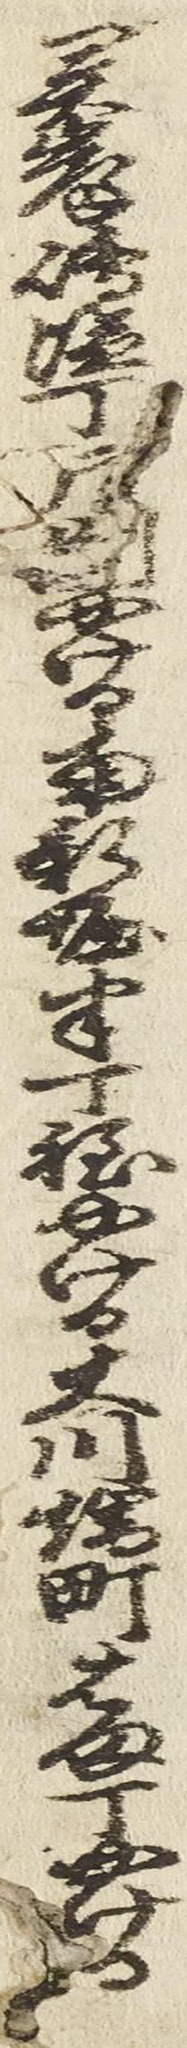霊岸嶋塩丁片側やける南新堀半丁程やける大川端町はま丁やける
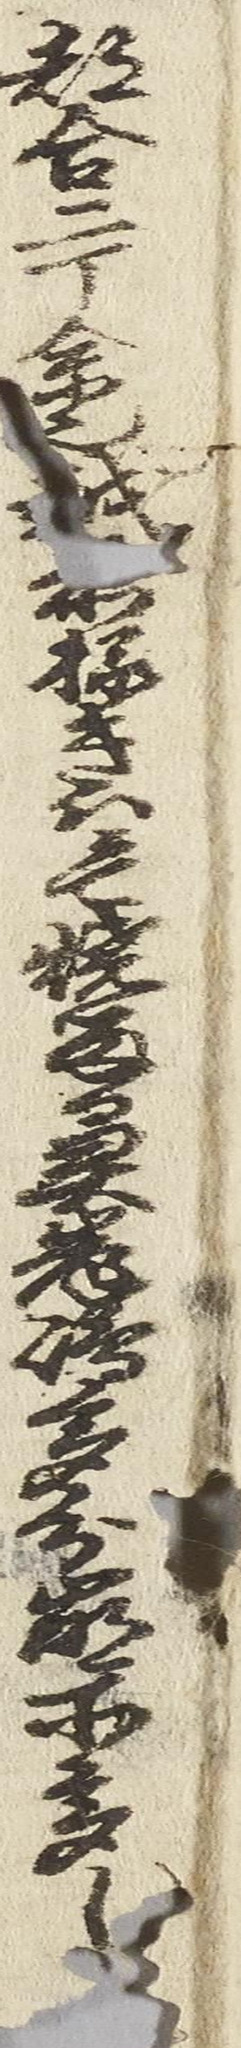都合二丁余也越前様きはニて焼留る霊岸嶋多分崩所多し
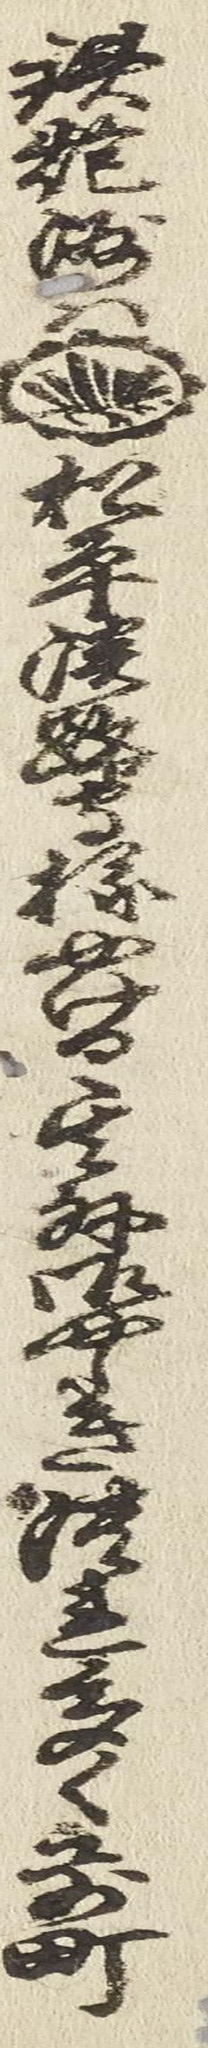鉄炮洲は松平淡路守様やける其外御やしき潰れ多く前町
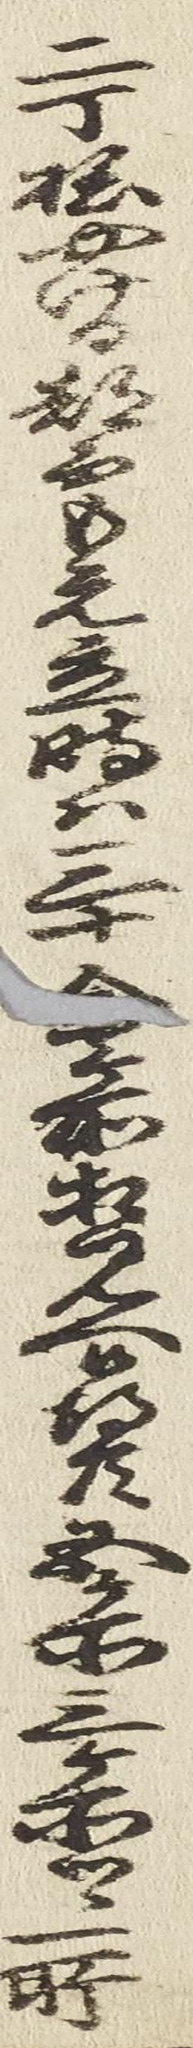二丁程やける都而もえ立時は三十余ヶ所相見へ候得共五ヶ所三ヶ所一所
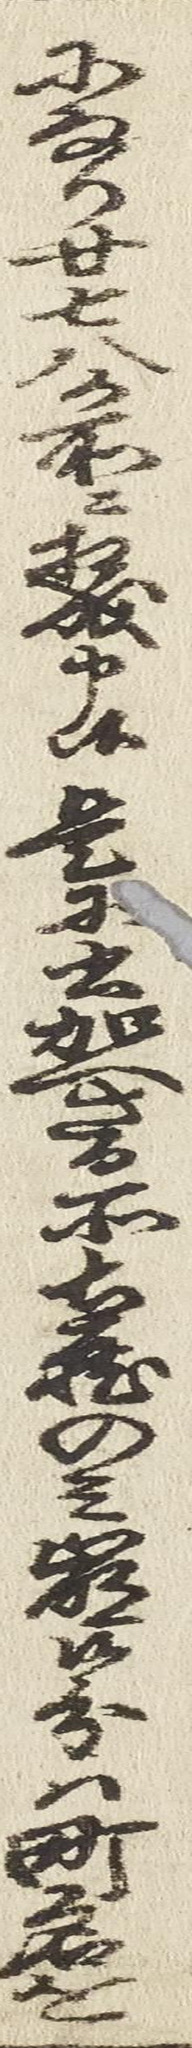になり廿七八か所ニ相成申候是に書加へさる所土蔵のみ崩候分は町名を
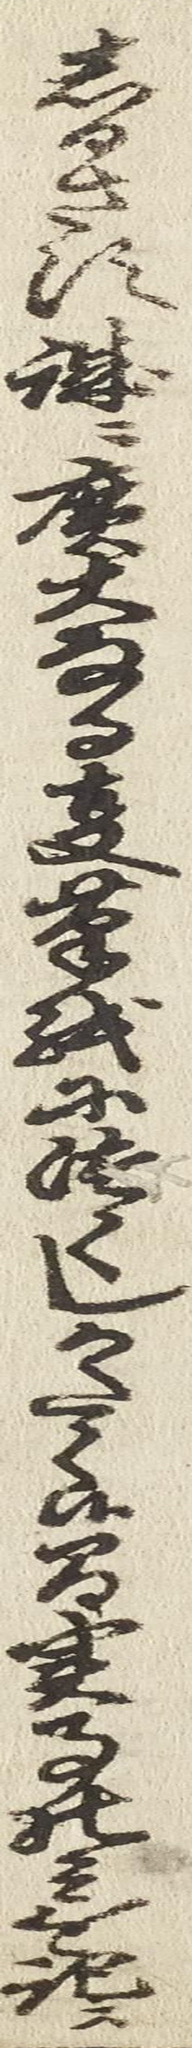しるさす誠に広大なる事筆紙につくしかたく候間実事のみを記ス
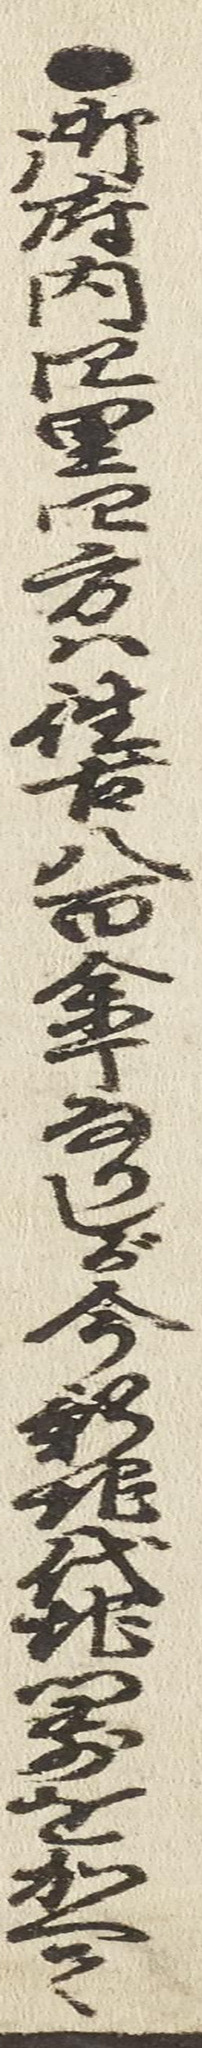●御府内四里四方は往古八百余丁なりしが今新地代地門前を加へて
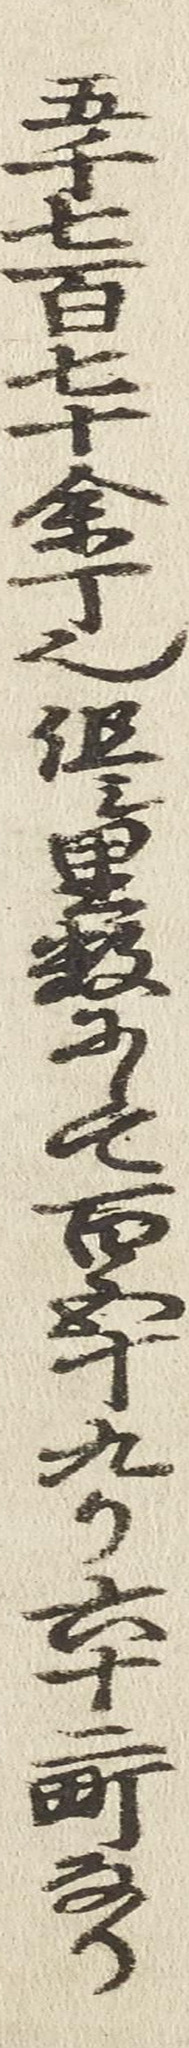五千七百七十余丁也但シ里数にして百五十九り六十二町なり
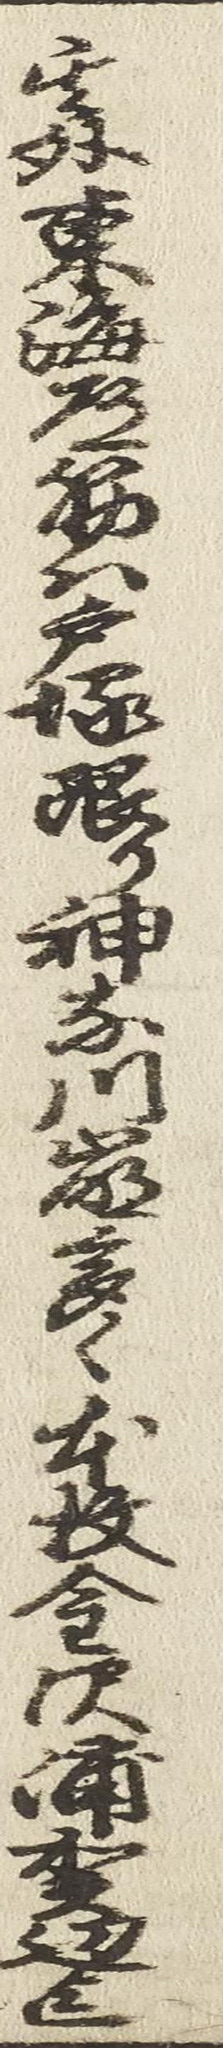其外東海道筋は戸塚限り神奈川崩多く本枚金沢浦賀辺迄
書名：江戸みやげ
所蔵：東京大学地震研究所図書室 Earthquake Research Institute Library, The University of Tokyo, JAPAN
